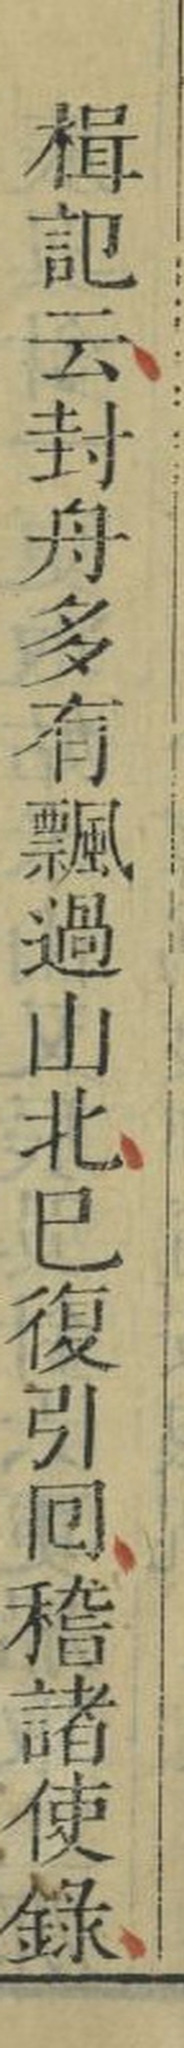楫記云封舟多有飄過山北巳復引囘稽諸使錄
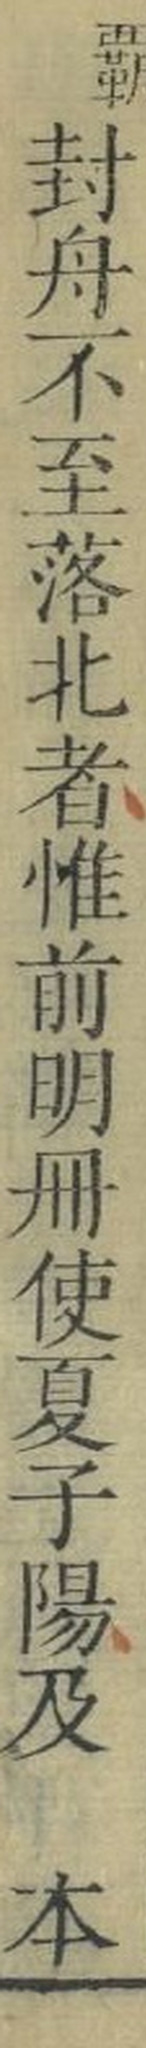覇封舟不至落北者惟前明冊使夏子陽及本
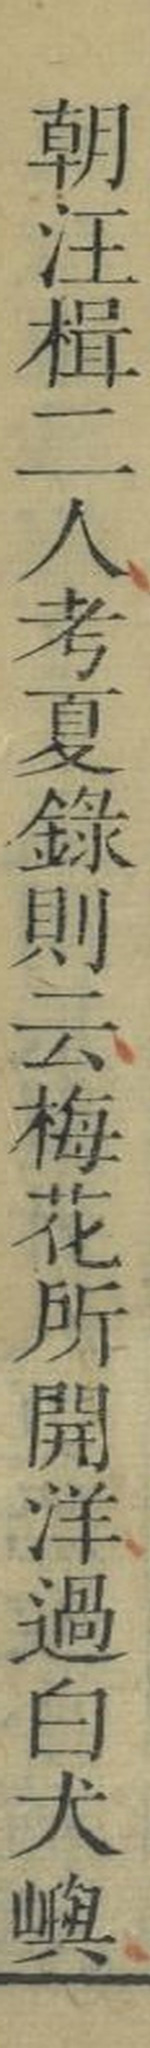朝汪楫二人考夏錄則云梅花所開洋過白犬嶼

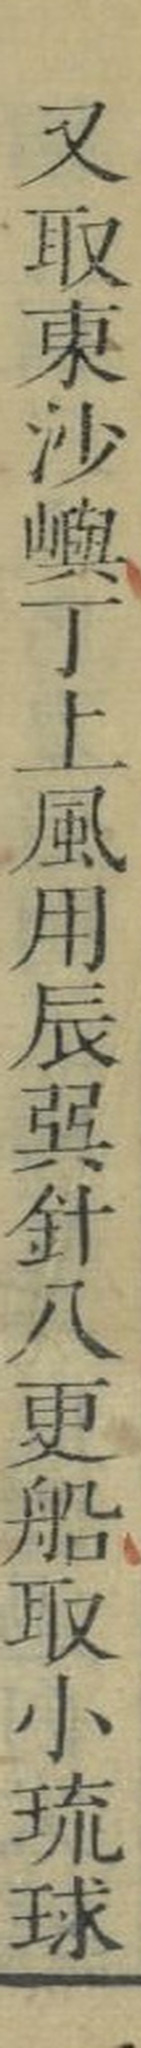又取東沙嶼丁上風用辰㢲針八更船取小琉球
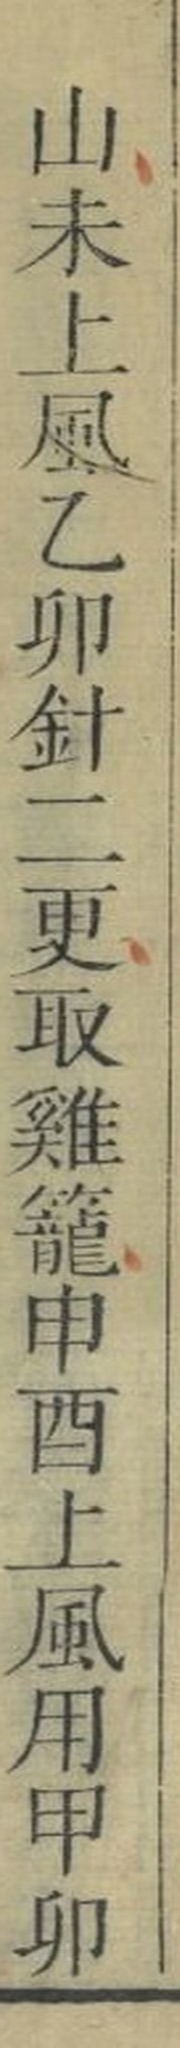山未上風乙卯針二更取雞籠申酉上風用甲卯
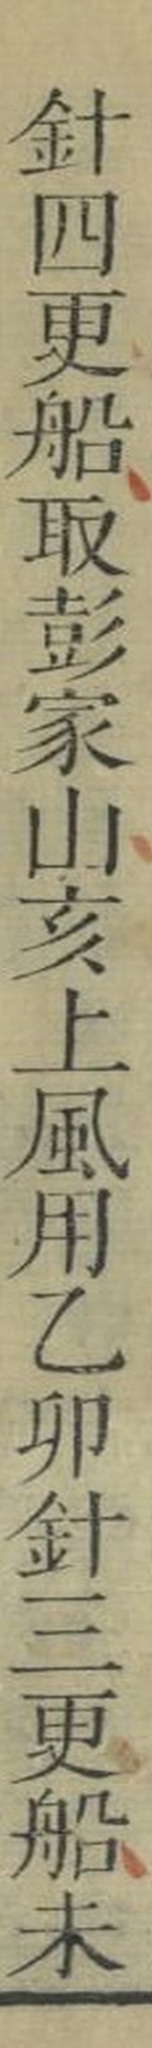針四更船取彭家山亥上風用乙卯針三更船未
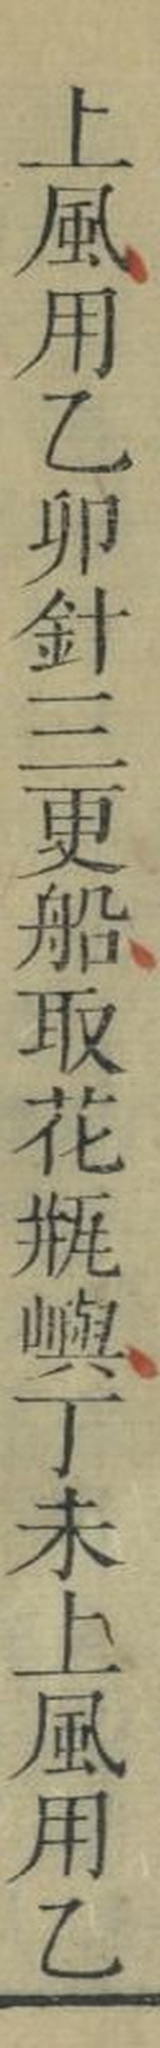上風用乙卯針三更船取花瓶嶼丁未上風用乙
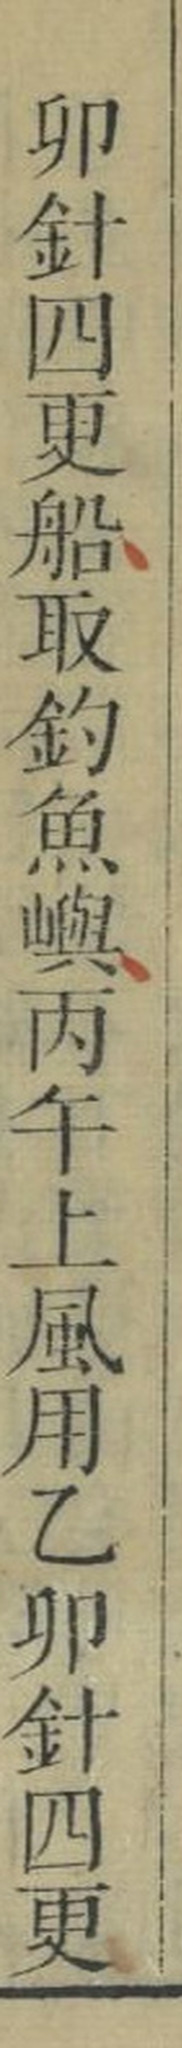卯針四更船取釣魚嶼丙午上風用乙卯針四更
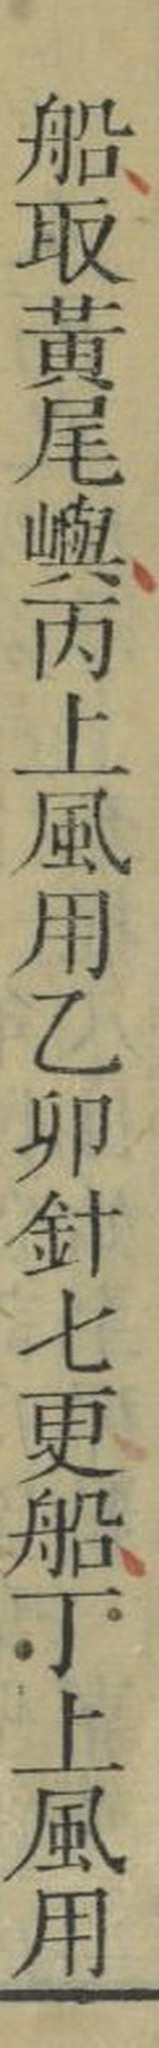船取黃尾嶼丙上風用乙卯針七更船丁上風用
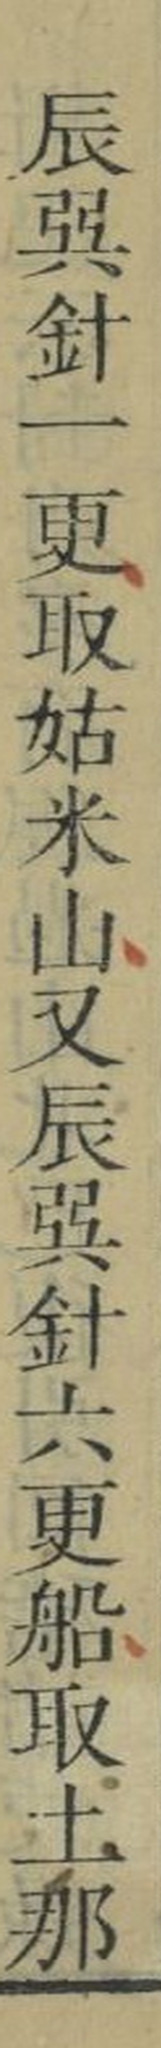辰㢲針一更取姑米山又辰㢲針六更船取土那
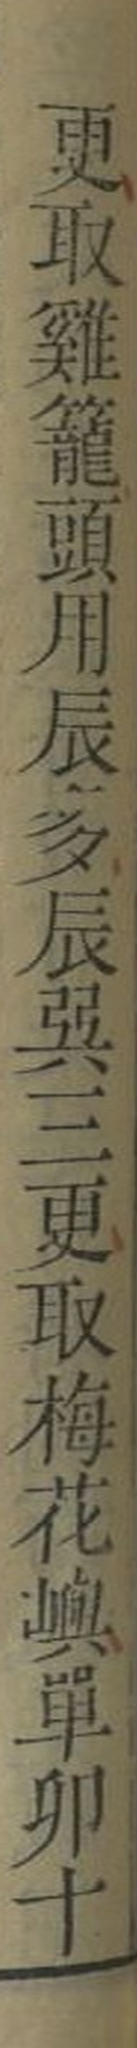更取雞籠頭用辰多辰㢲三更取梅花嶼單卯十
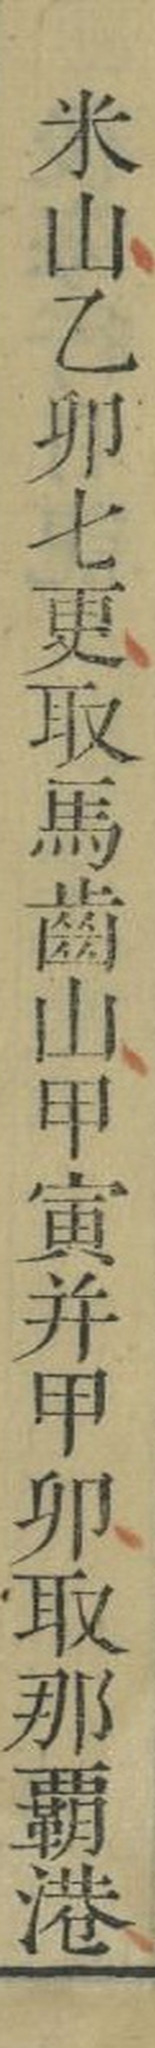米山乙卯七更取馬齒山甲寅并甲卯取那覇港
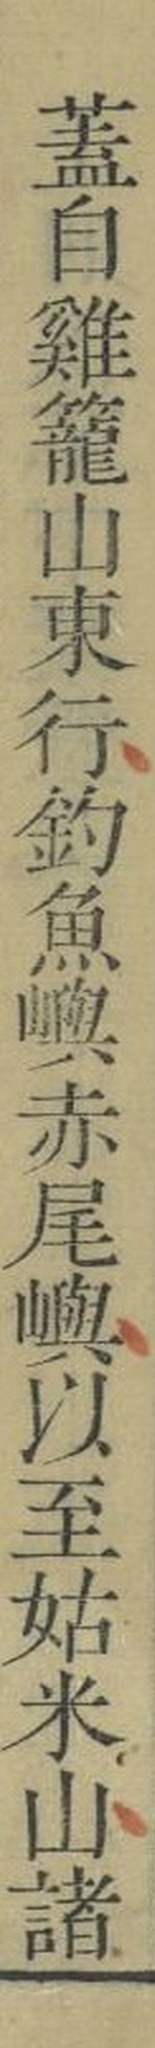蓋自雞籠山東行釣魚嶼赤尾嶼以至姑米山諸
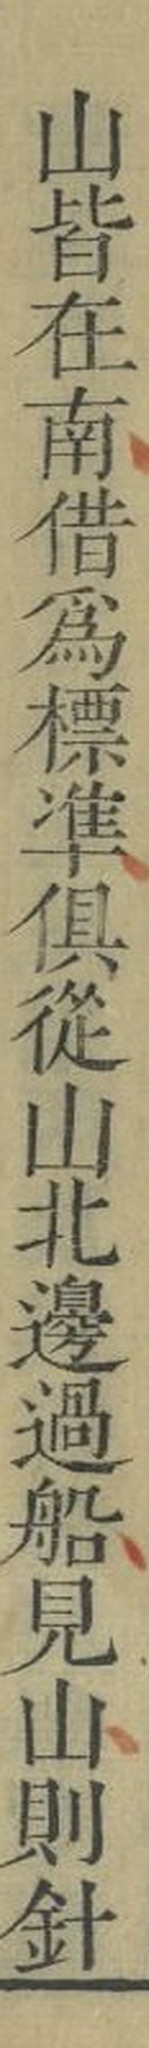山皆在南借爲標準俱從山北邊過船見山則針
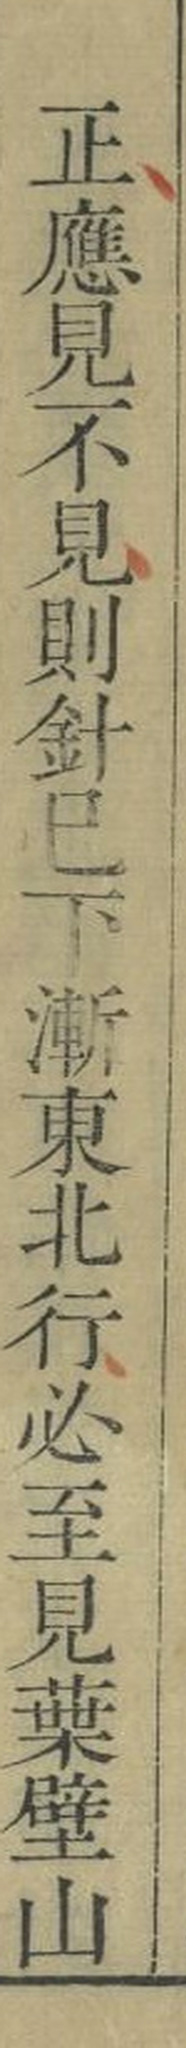正應見不見則針巳下漸東北行必至見葉壁山
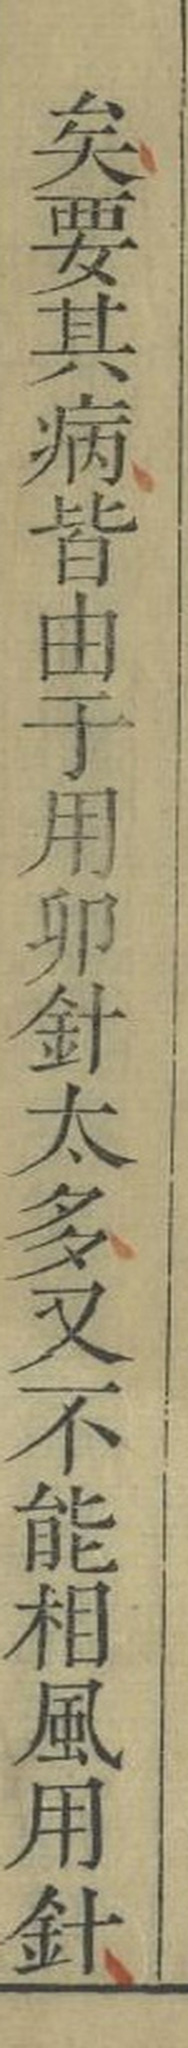矣要其病皆由于用卯針太多又不能相風用針
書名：中山伝信録 巻一、巻二
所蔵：University of the Ryukyus Library
